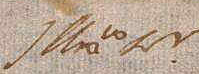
Illmo sor
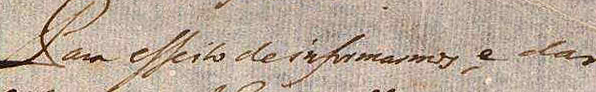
Para effeito de informarmos, e dar
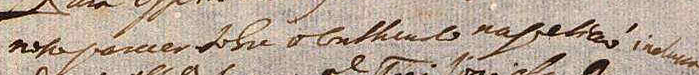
noso parecer sobre o contheudo na petiçaõ incluza
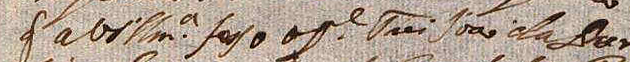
q̄ a V Illm.a fes o o p.e Frei Joaõ da Por
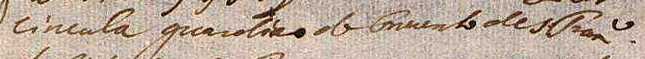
cincula guardiaõ do conuento de s Franco.
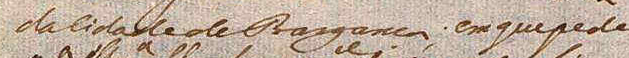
da cidade de Bargança; em que pede
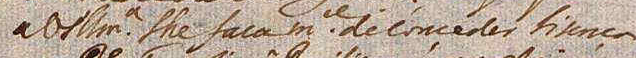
a V Illm.a lhe faça m.ce de conceder lisença
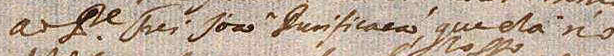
ao P.e Frei Joaõ Purificaçaõ, que ela no
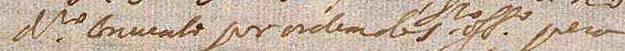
d.to conuento por ordem do s.to off.o pera
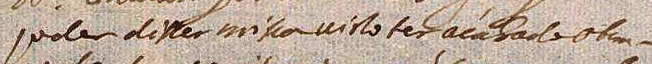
poder disser missa uisto ter acabado o tem
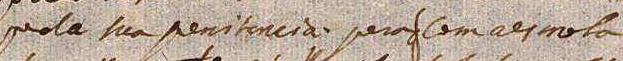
po da sua penitencia pera q̄ com a esmola
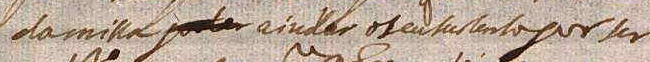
da missa poder aiudar o seu sustento por ser
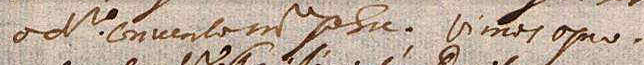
o d.to conuento mto pobre; vimos o pro
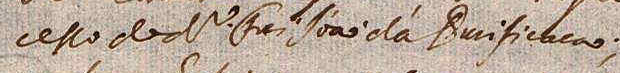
cesso do do. Frei Joaõ da Purificaçaõ;
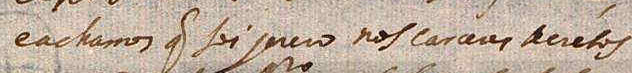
e achamos q̄ foi prezo nos carceres secretos
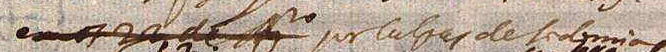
em os 22 de Ago por culpas de sodomia
